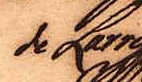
de Larre
